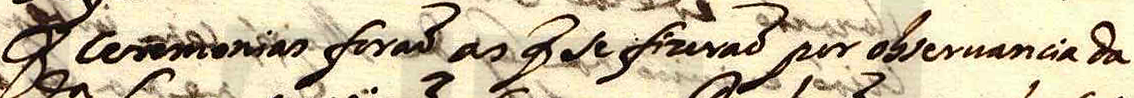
Q ceremonias foraõ as q̄ se fizeraõ por obseruancia da
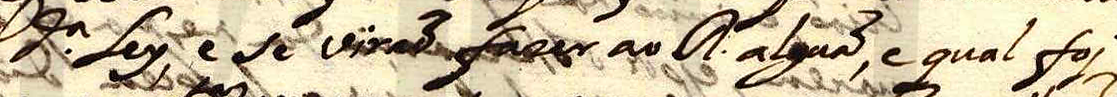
d.a Ley, e se viraõ fazer ao R. alguā, e qual foj
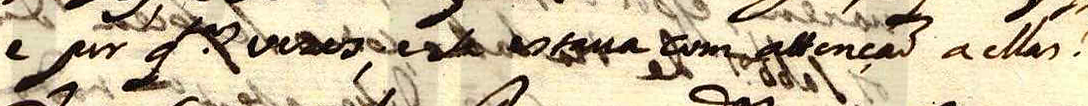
e por q.tas vezes, e se estaua com attençaõ a ellas?
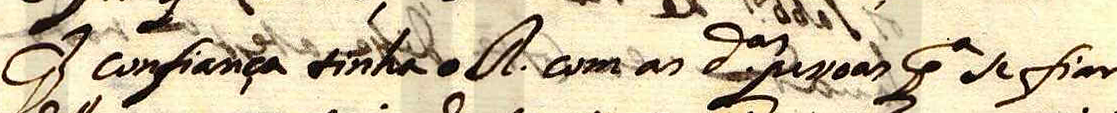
Q̄ confiança tinha o R. com as das pessoas pa se fiar
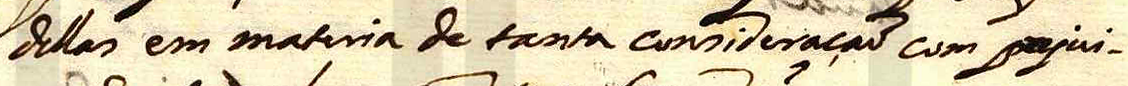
dellas em materia de tanta consideraçaõ com prejui
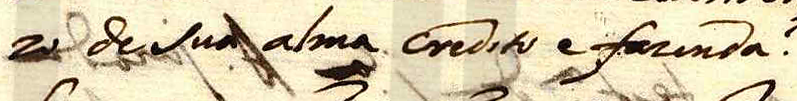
zo de sua alma credito e fazenda?
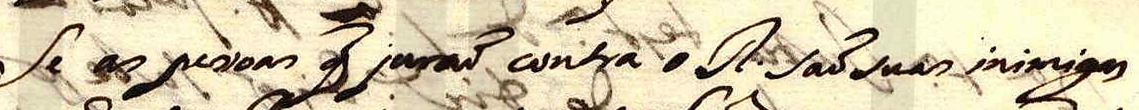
Se as pesoas q̄ juraõ contra o R. saõ suas inimigas
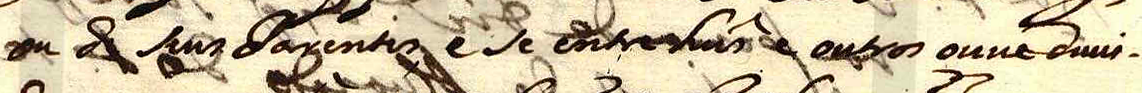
ou de seus Parentes, e se entre hus̄ e outros ouue duui
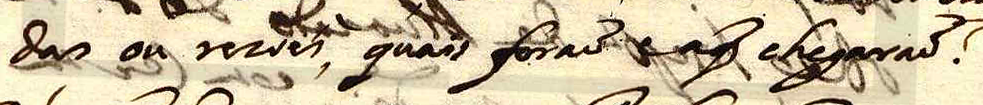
das ou rezoes, quais foraõ e a q̄ chegaraõ?
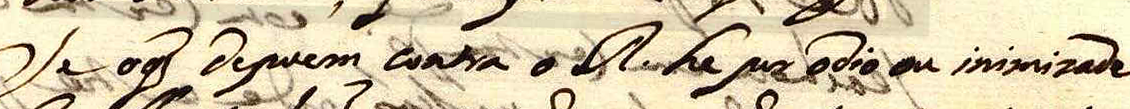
Se o q̄ depoem contra o R. he por odio, ou inimizade
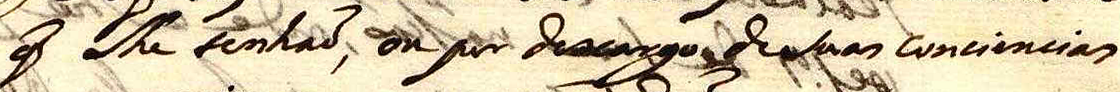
q̄ lhe tenhaõ, ou por descargo de suas conciencias
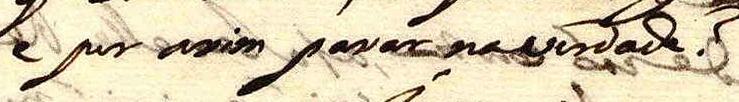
e por asim pasar na verdade?
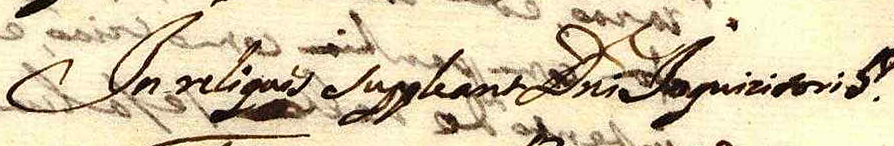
In reliques suppleant Dni Inquizitorib?
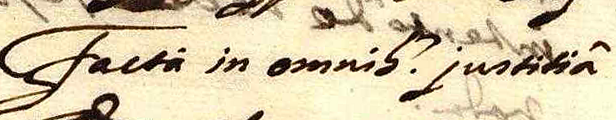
Facta in omnib? justitia
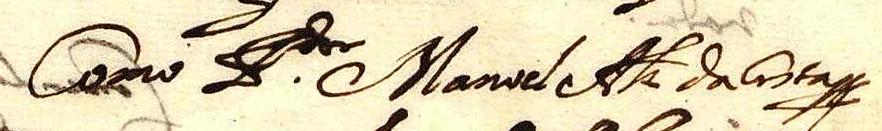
Como P.or Manoel Alz̄ da Costa
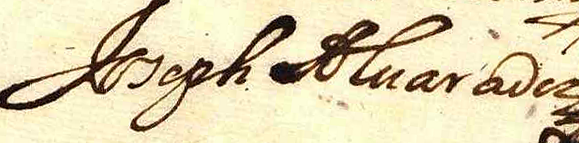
Joseph Aluarado
